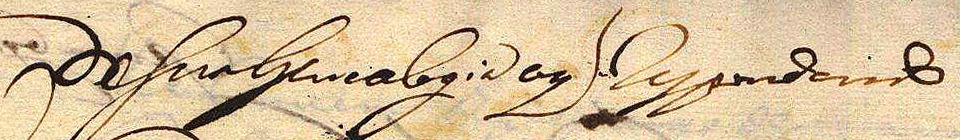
de sua Genealogia o q̄ Respondendo
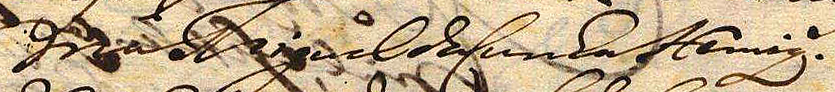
ma Miguel da Cunha Henriq.s
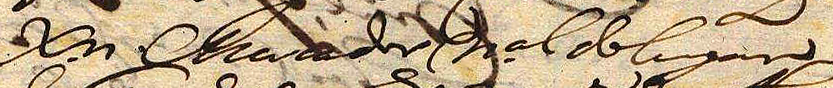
x. n. Mercador n.al do lugar
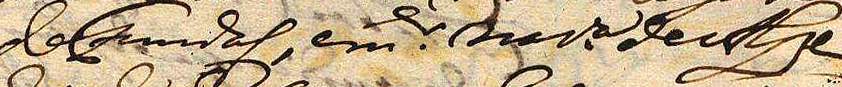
do Fundaõ, e m.or na v.a de Alpe
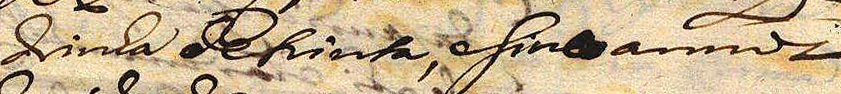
drinha de trinta, e sinco annos
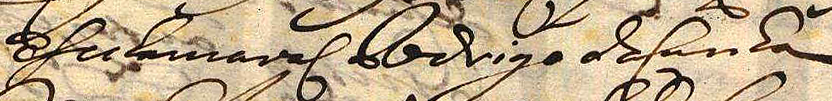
E se chamavaõ Rodrigo da Cunha
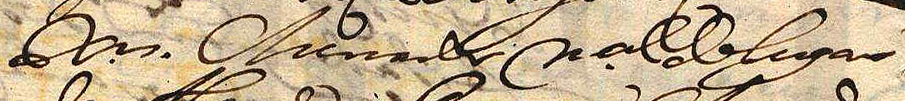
Xer. Mercador nal do lugar
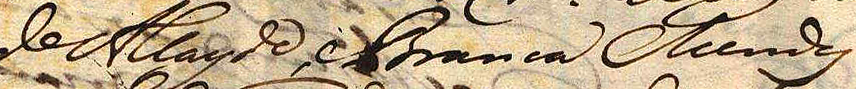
de Alcayde, e Branca Mendes
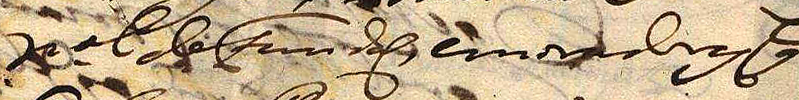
nal de Fundaõ, e moradores q̄
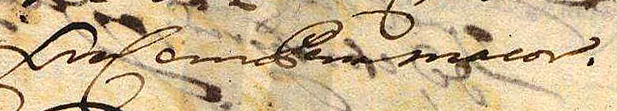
foraõ em Penamacor.
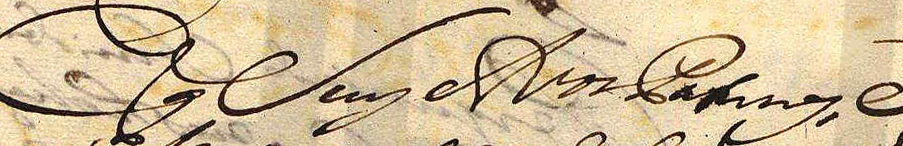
E q̄ Seus Avos Paternos, e
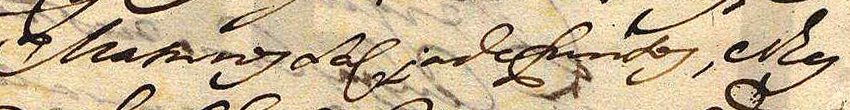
Maternos Saõ ja defuntos, e lhes
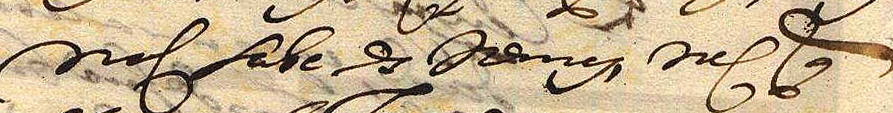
naõ sabe os nomes, nē q̄
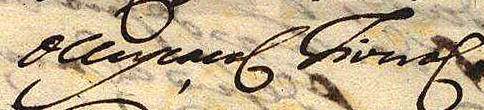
occupaçaõ tiveraõ
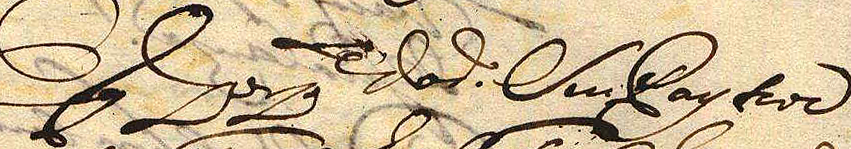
E q̄ por pte do d.o Seu Pay seos
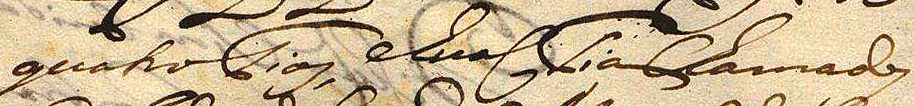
quatro Tios, e huā Tia chamados
